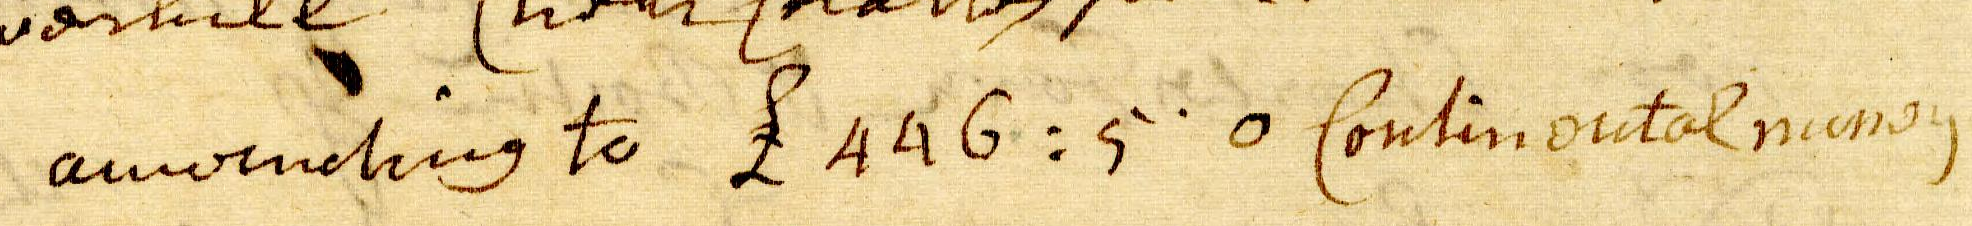amounting to £446:5 0 Continental money
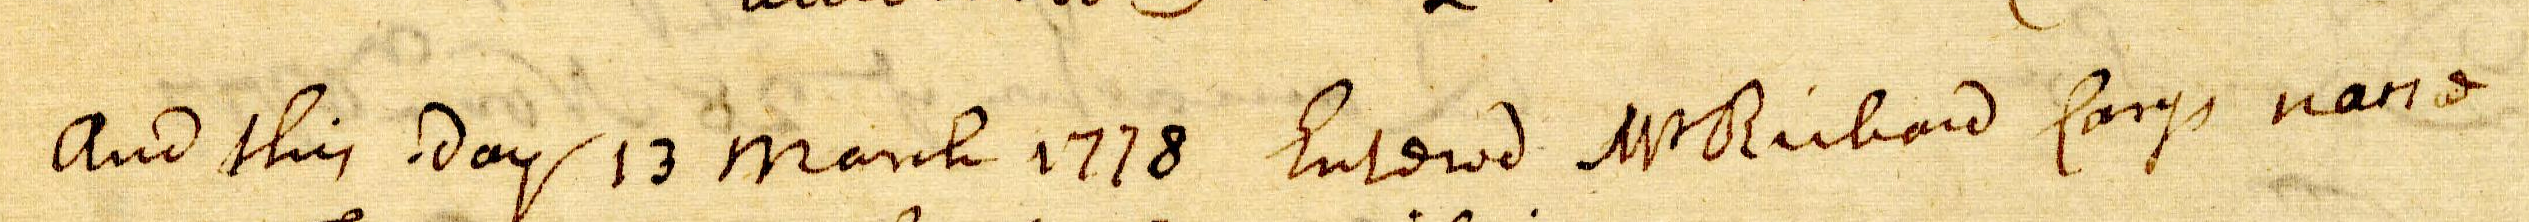And this day 13 March 1778 Enter'd M^r Richard Carys name
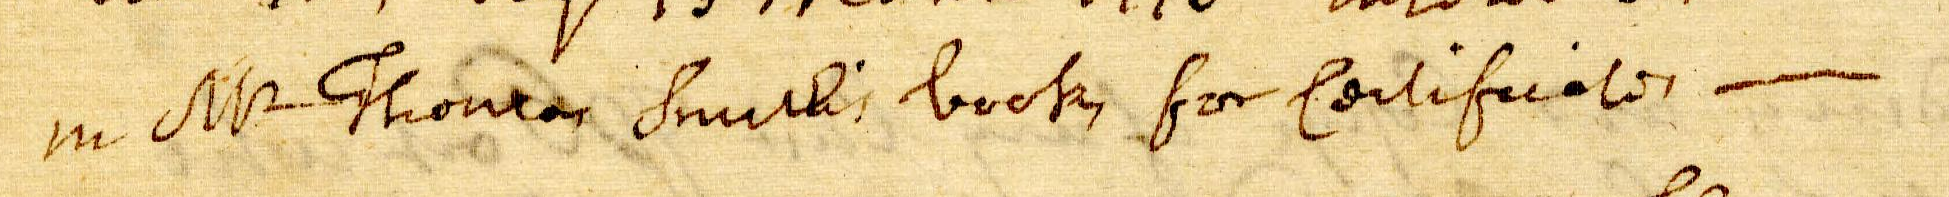in M^r Thomas Smith's book for Certificates
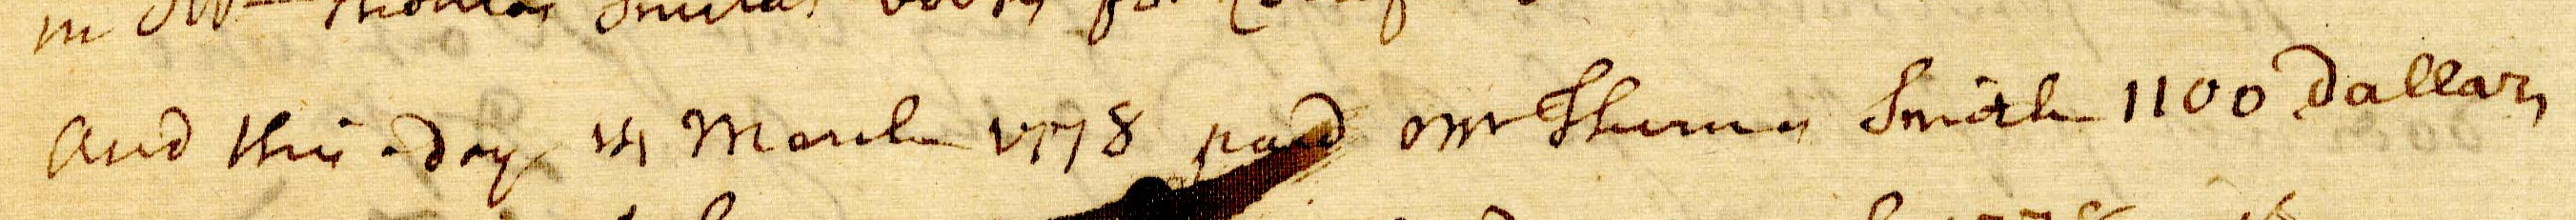and this day it March 1778 paid M Thomas Smith 1100 dollars
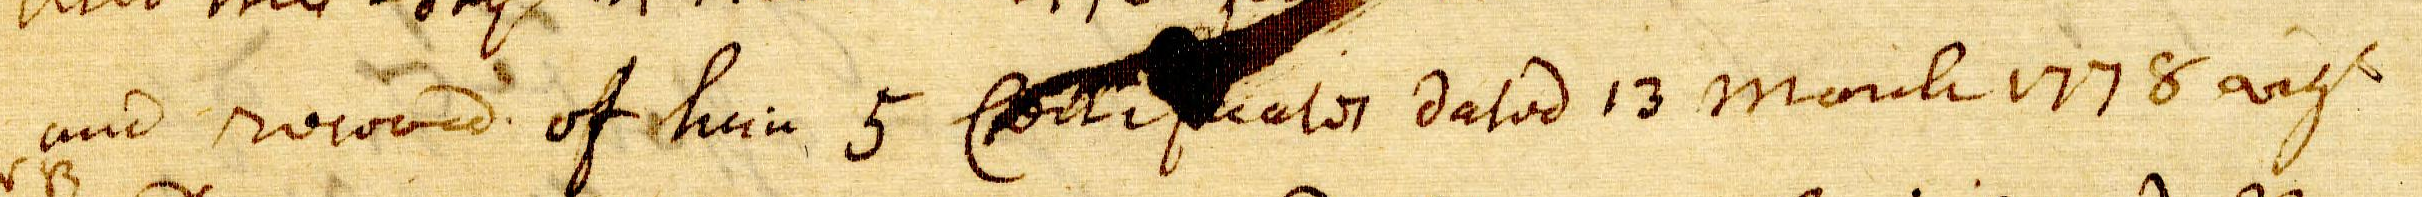and received of him 5 Certificates dated 13 March 1778 a y^e
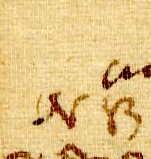NB
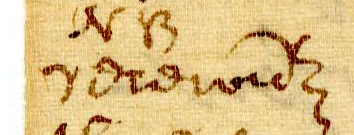receved
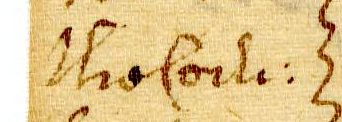Tho Carle:
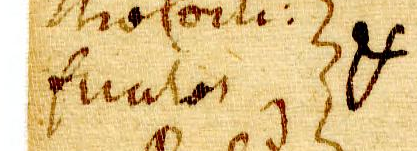Coates &
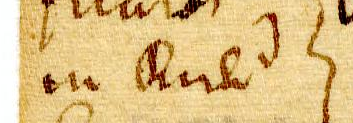in Rich^d
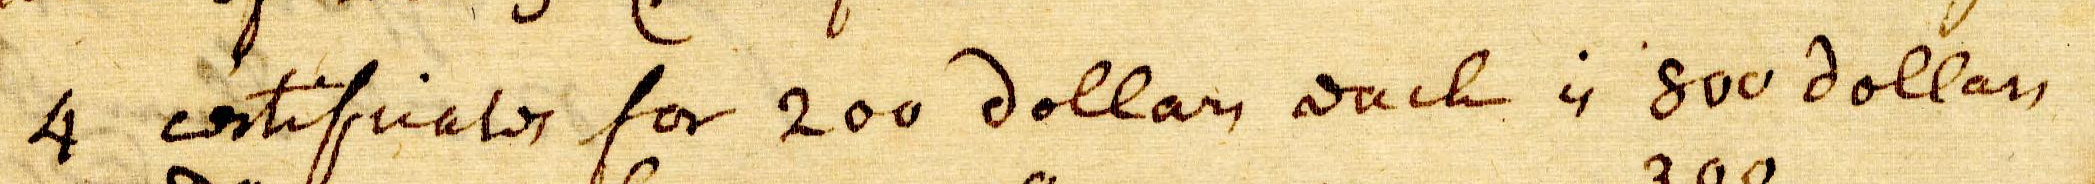4 certificates for 200 dollars wich is 300 dollars
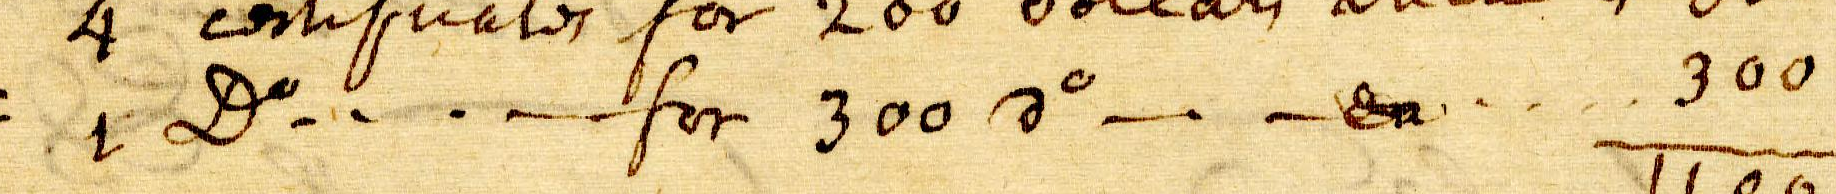1 D^o--.- for 300 d^o--[__]- 300
